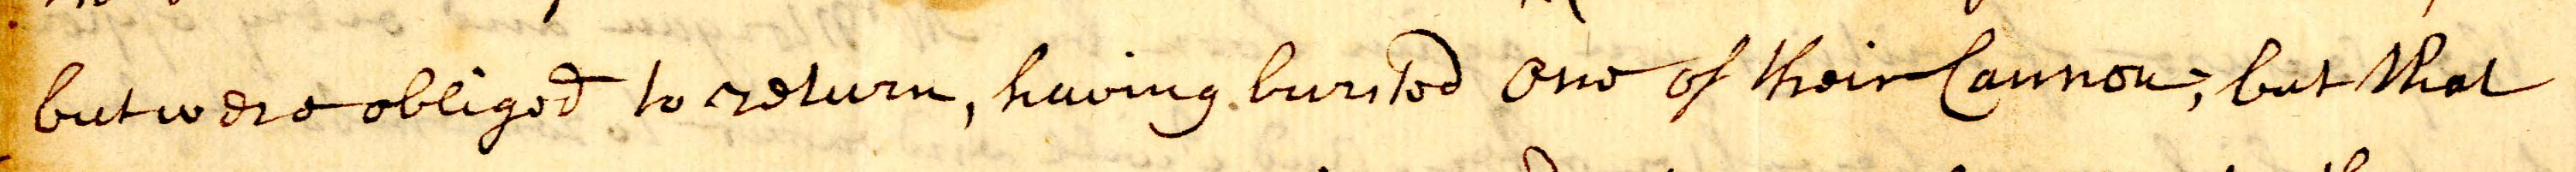but were obliged to return, having bursted one of their Cannon, but that
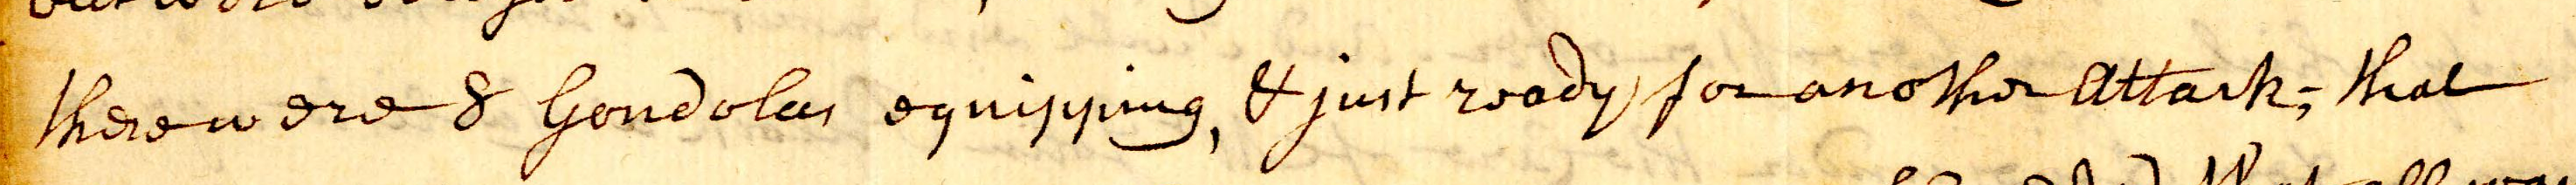these wore & Gondolas equipping, & just ready for another Attack, that
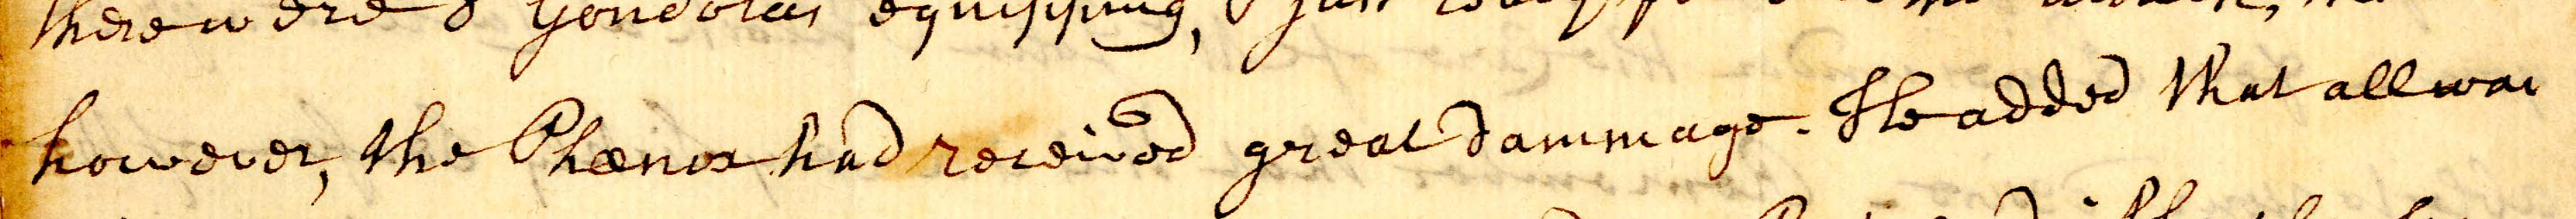however, the Phoenix had received great dammage. He added that all was
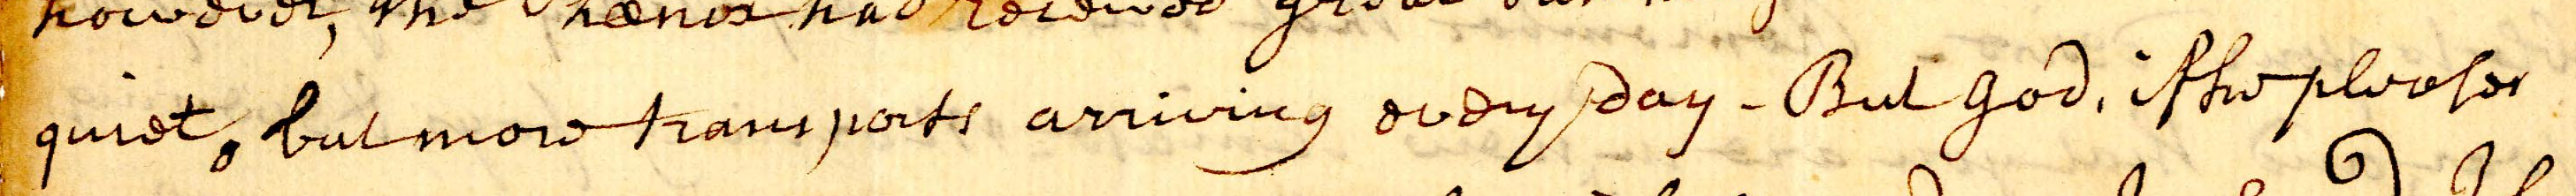quiet, but more transports arriving every day- But god, if the ploaser
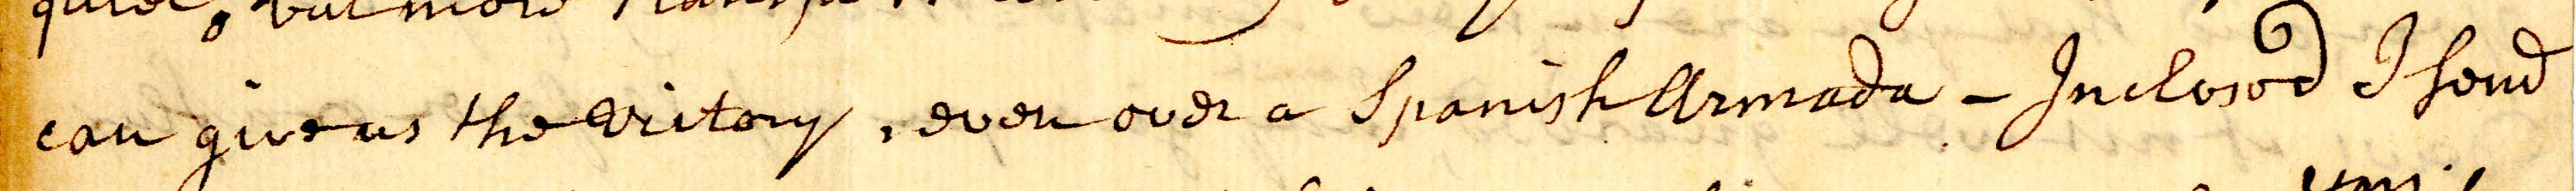can give us the victory, even over a Spanish Armada- Inclosed I send
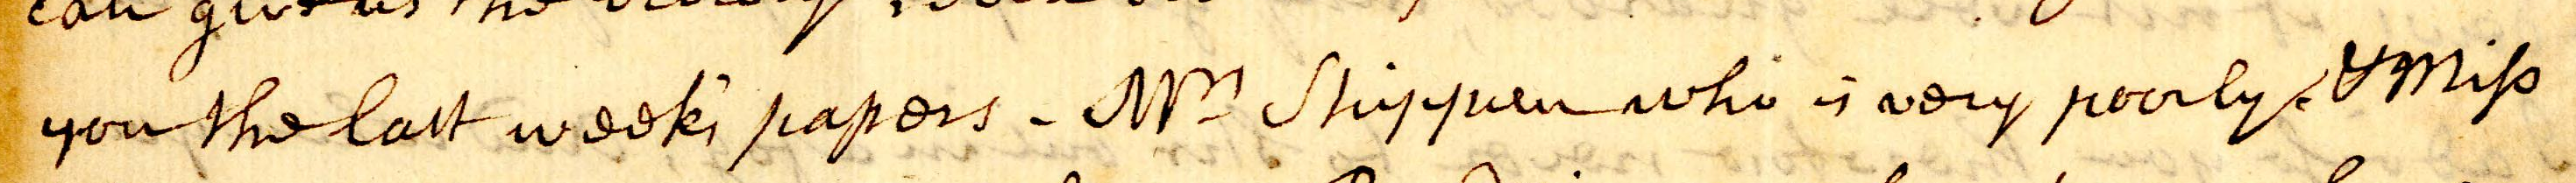you the last week papers- M^rs Shippen who is very poorly & Miss
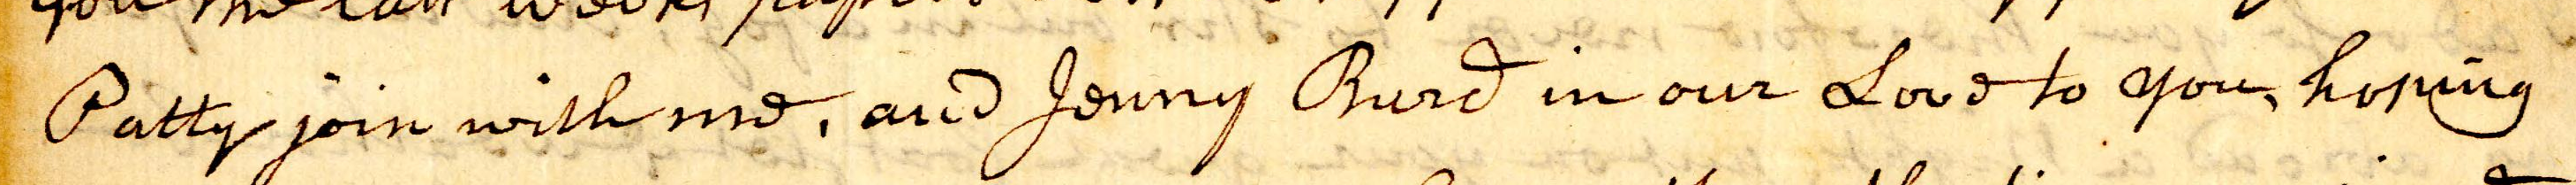Patty join with me, and Jonny Burd in our Love to you, hoping
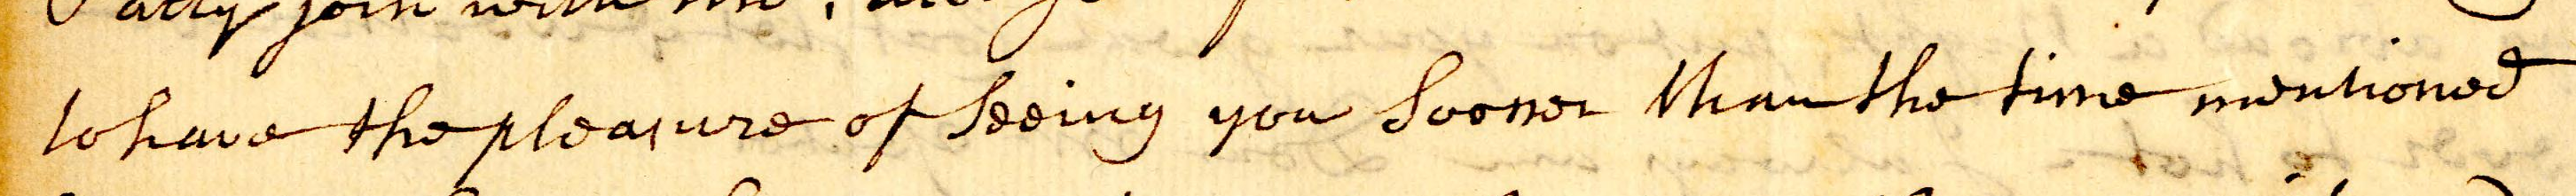to have the pleasure of seiing you Sooner then the time mentioned
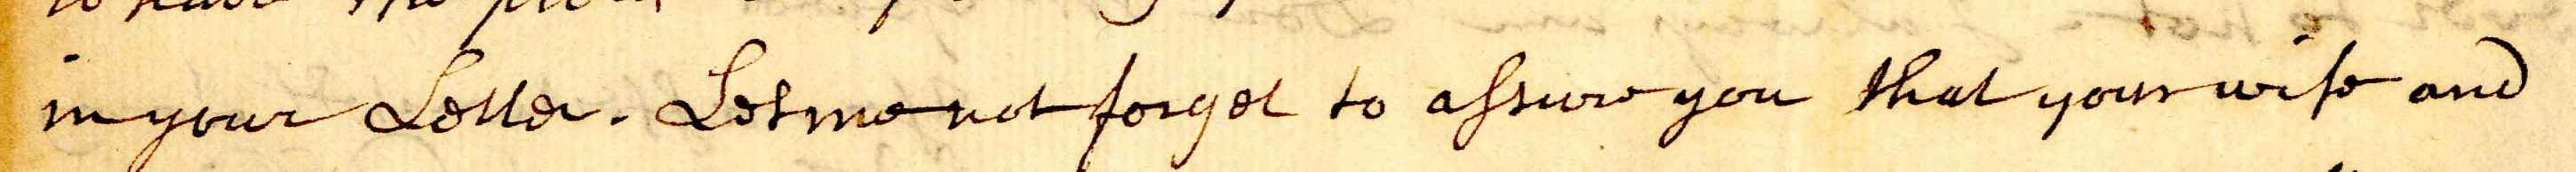in your Letter. Let me not forget to assure you that your wife and
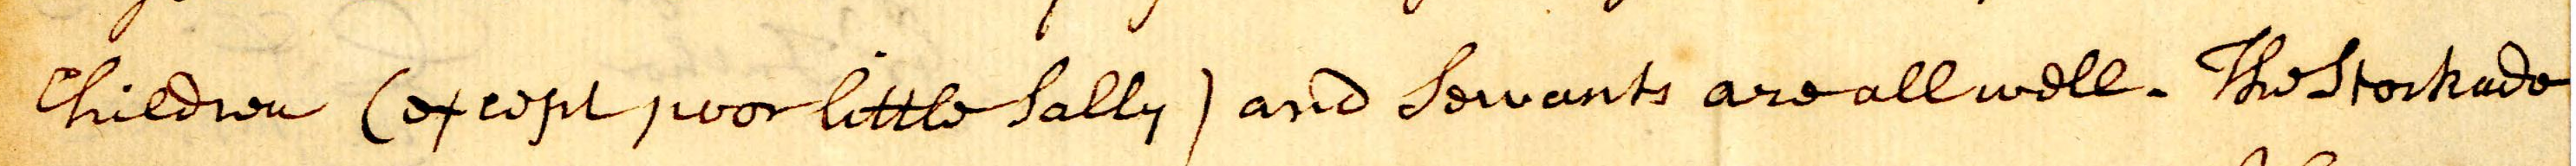Children (except poor little Sally) and Servants are all well. The Stockade
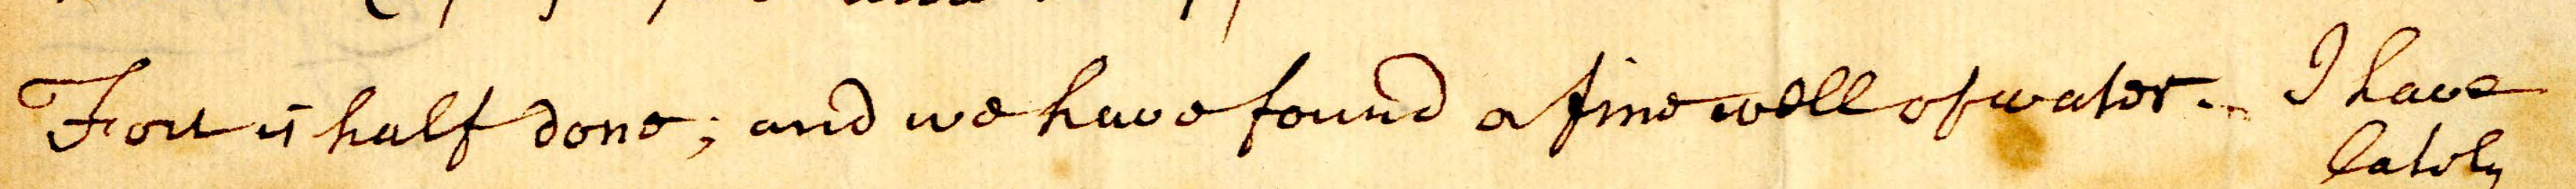Fort is half done; and we have found a fine well of water.- I have
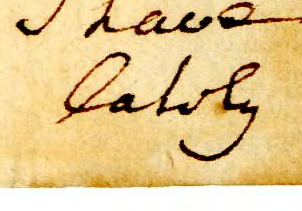lately
